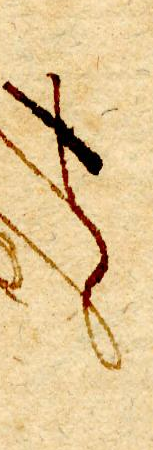21t
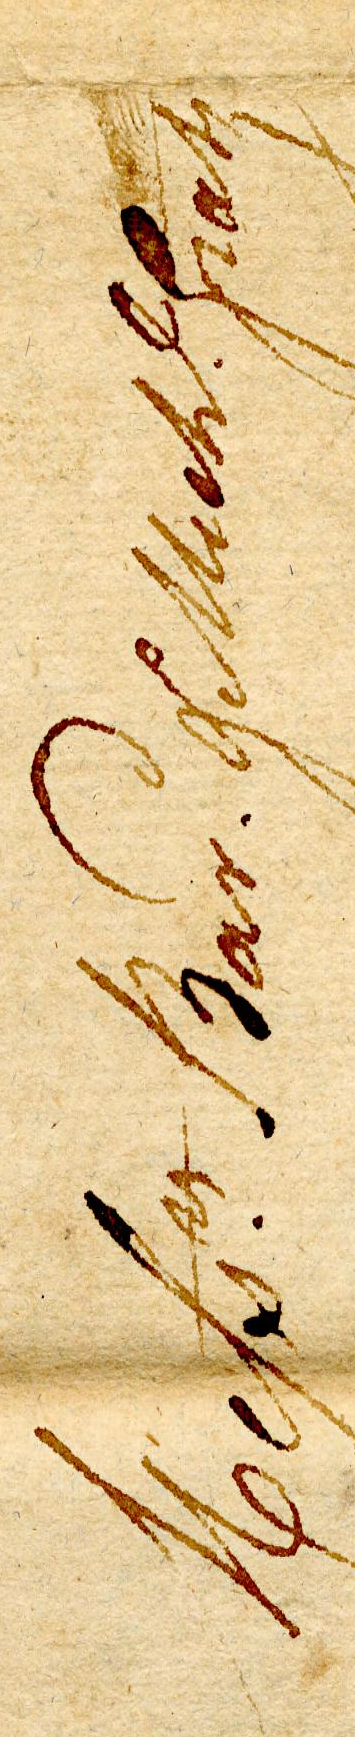Mess^rs Bar^d & Mich^l Gratz
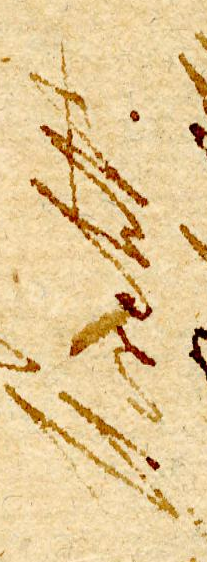Mercht^s.
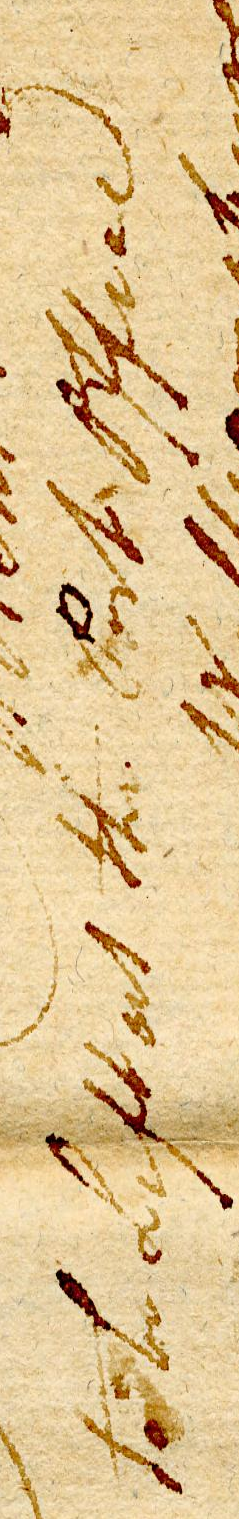to be left at the Port Office
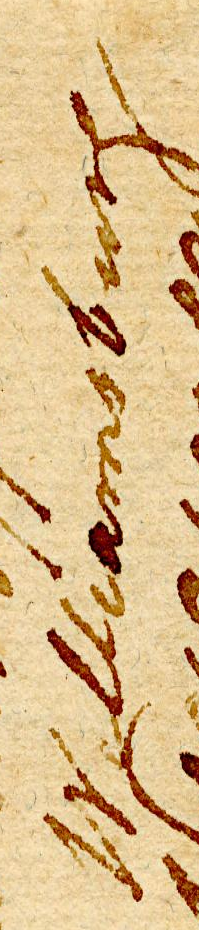Williamsburg
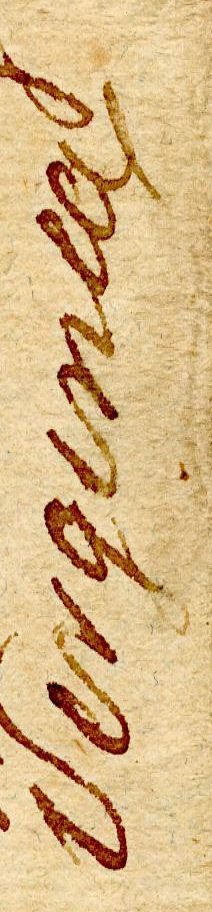Virginia
